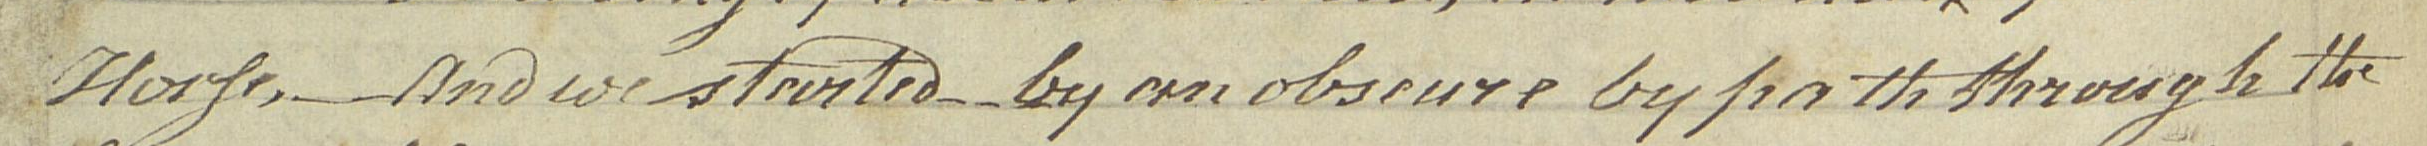Horse, And we started by an obscure by path through the
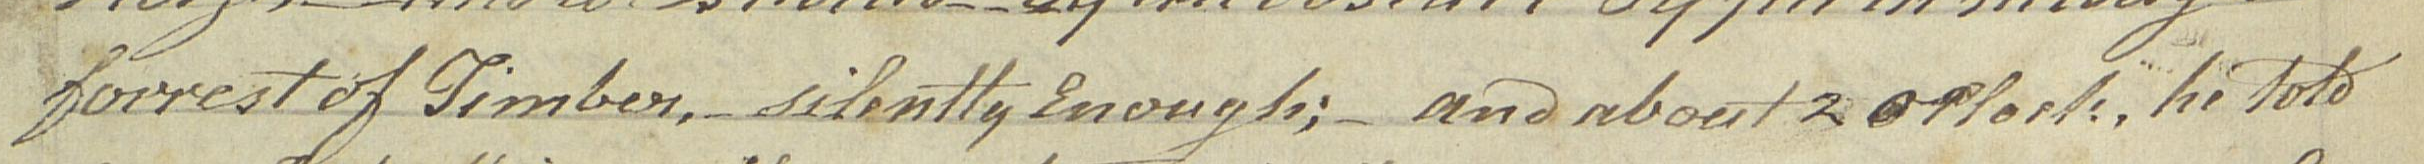forrest of Timber, silently Enough; and about 12 OClock, he told
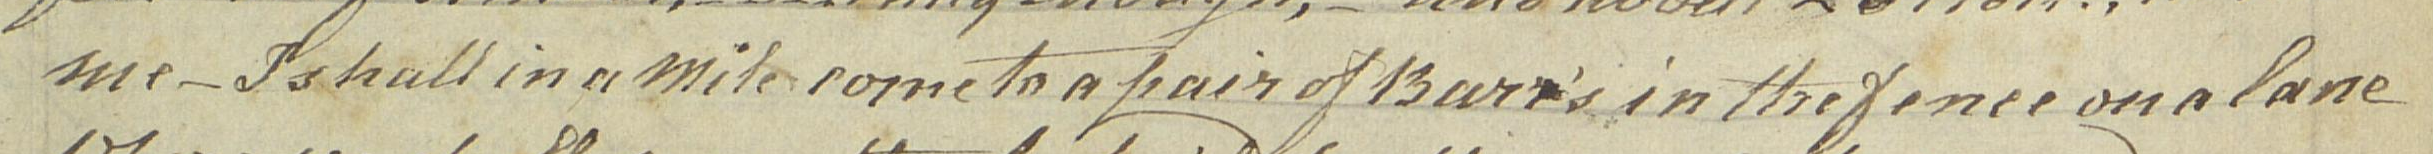me- I shall in a Mile come to a pair of Barr's in the fence on a lane
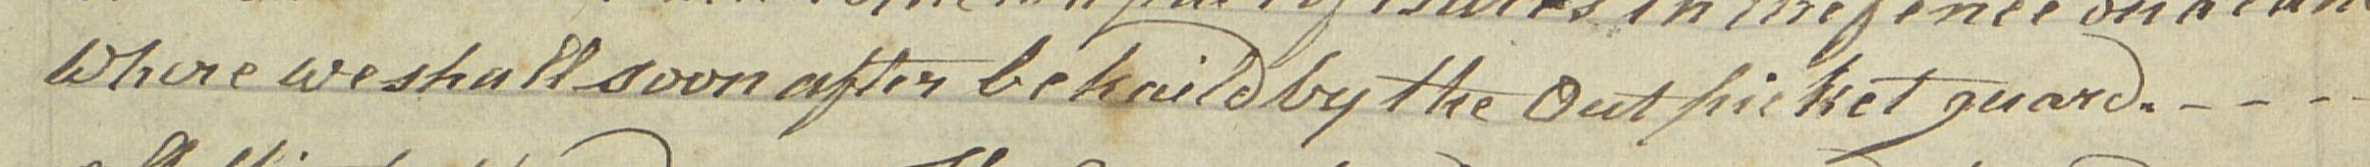where we shall soon after behaild by the Out picket guard.
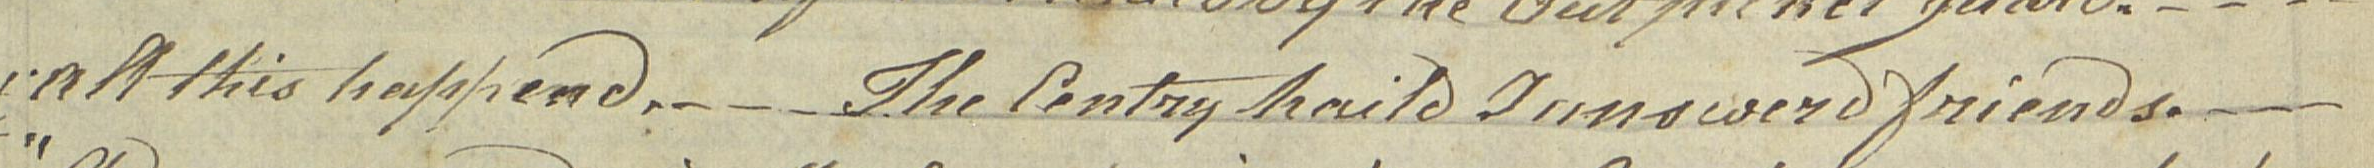all this happend. The Centry haild I answered friends.
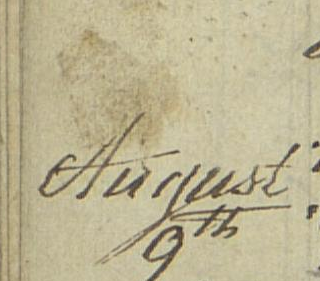August
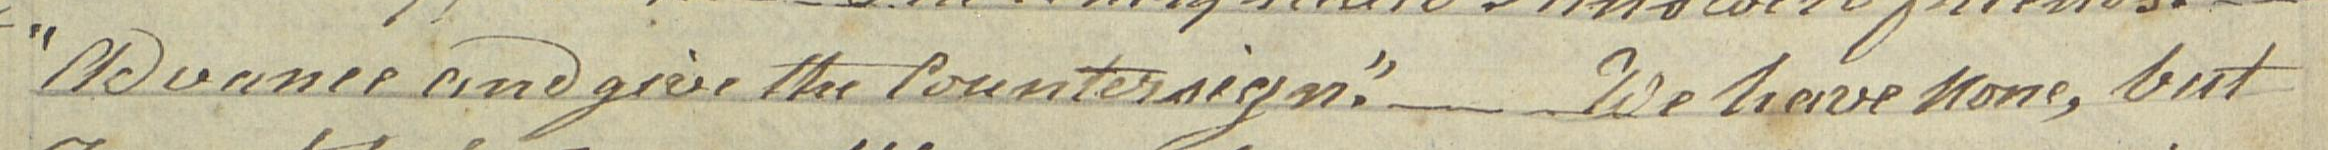"Advance and give the Countersign." We have none, but
